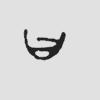曰
